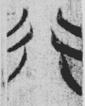行
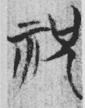祝
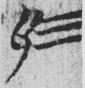於
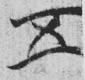五
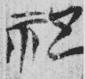祀
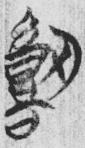○（豈）
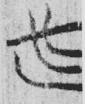必
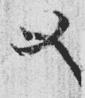又（有）
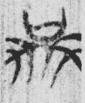益
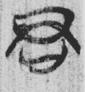君
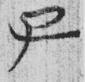子
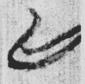㠯（以）
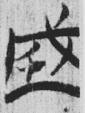城（成）
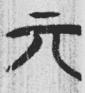亓（其）
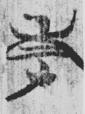考（孝）
